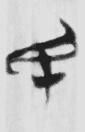民
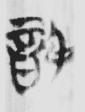{言身}
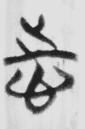志
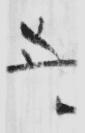之
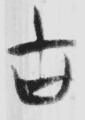古
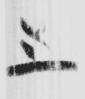之
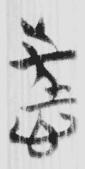{心之𡈼}
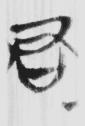君
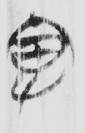{宀卑}
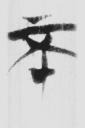不
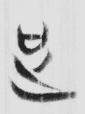足
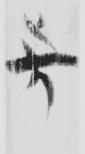先
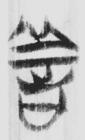善
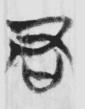君
